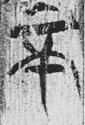不
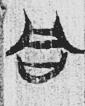同
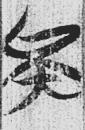矣
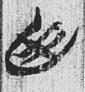臣
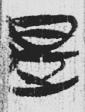是
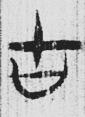古（故）
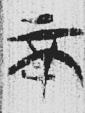不
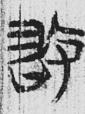敢
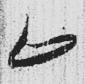㠯
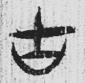古（故）
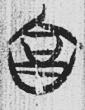○（答）
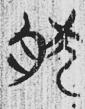○（然）
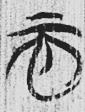而
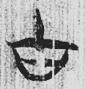古
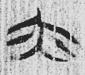亦
